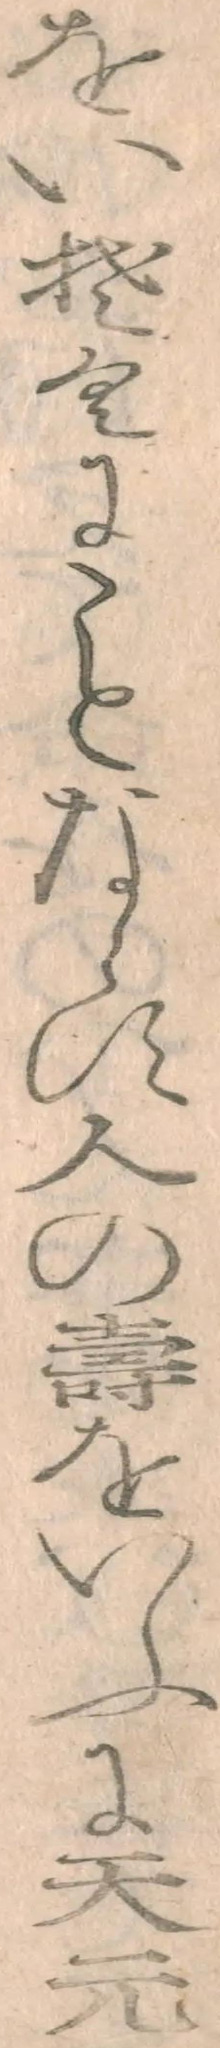をいそくにことならす人の寿をいふに天元
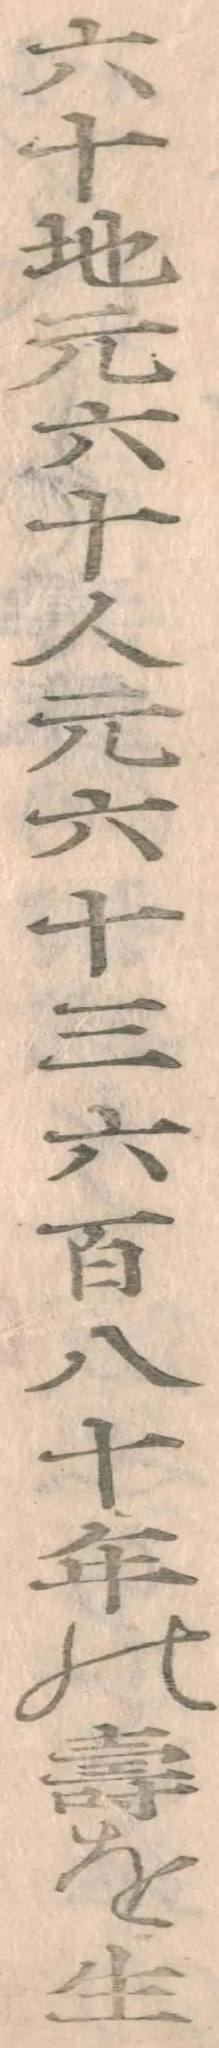六十地元六十人元六十三六百八十年の寿を生
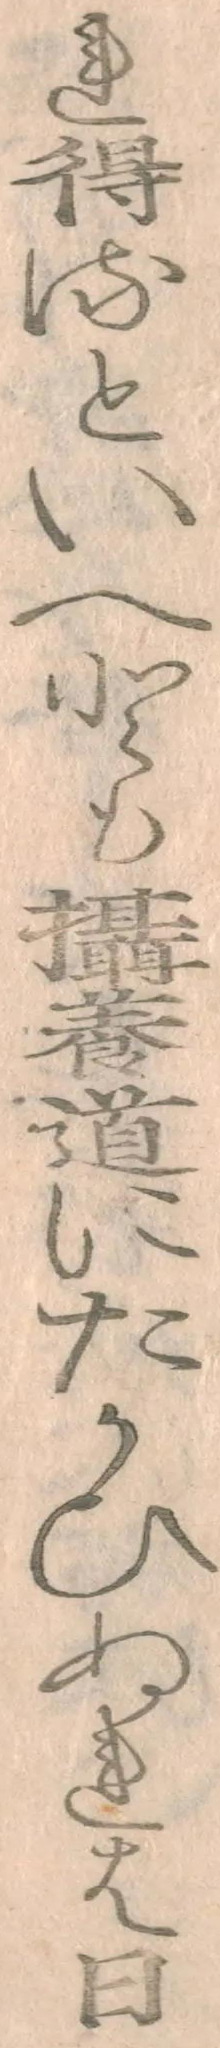れ得るといへとも摂養道にたかひぬれは日
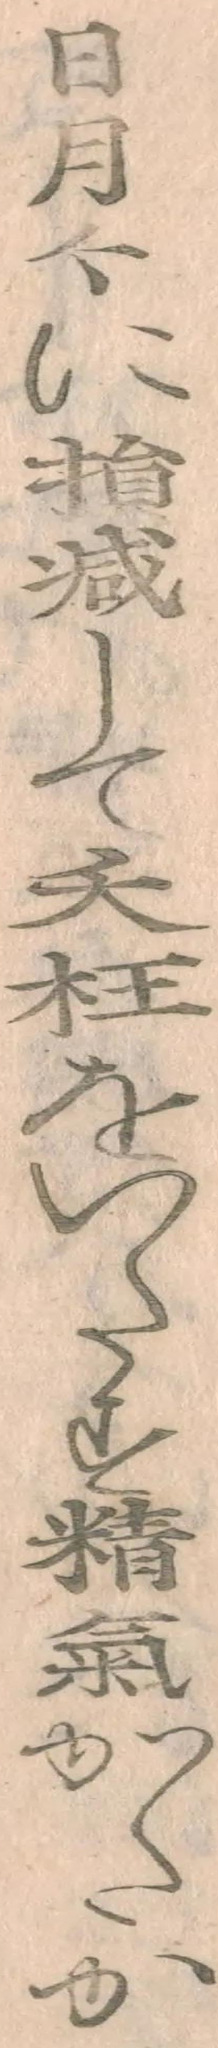日月々に損減して夭枉をいたす精気かたか
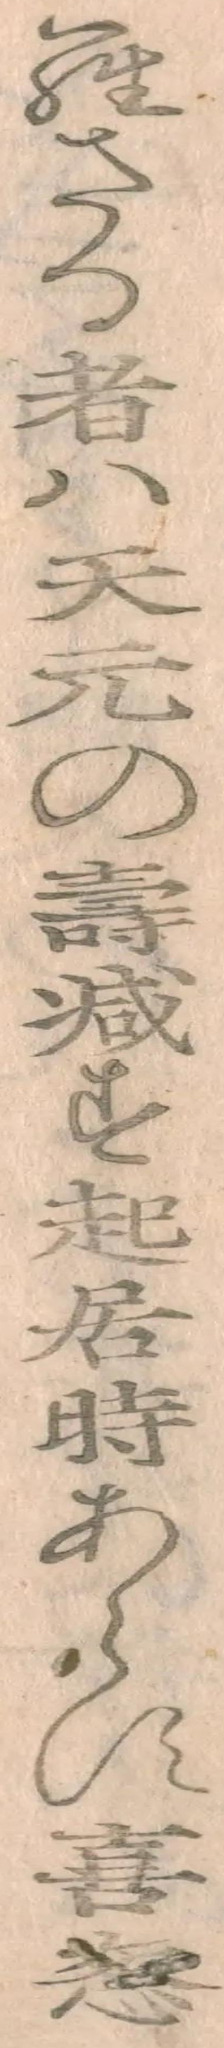らさる者は天元の寿減す起居時あらす喜怒
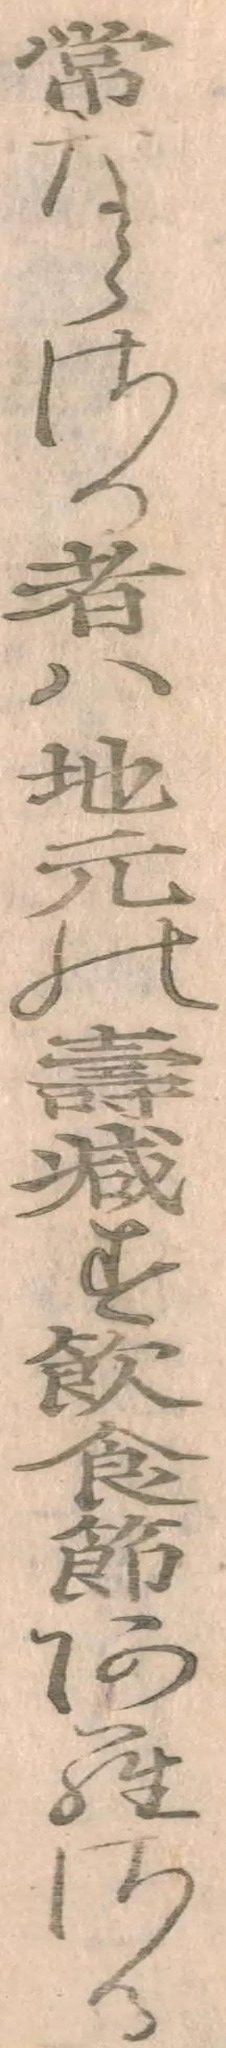常ならさる者は地元の寿減す飲食節あらさる
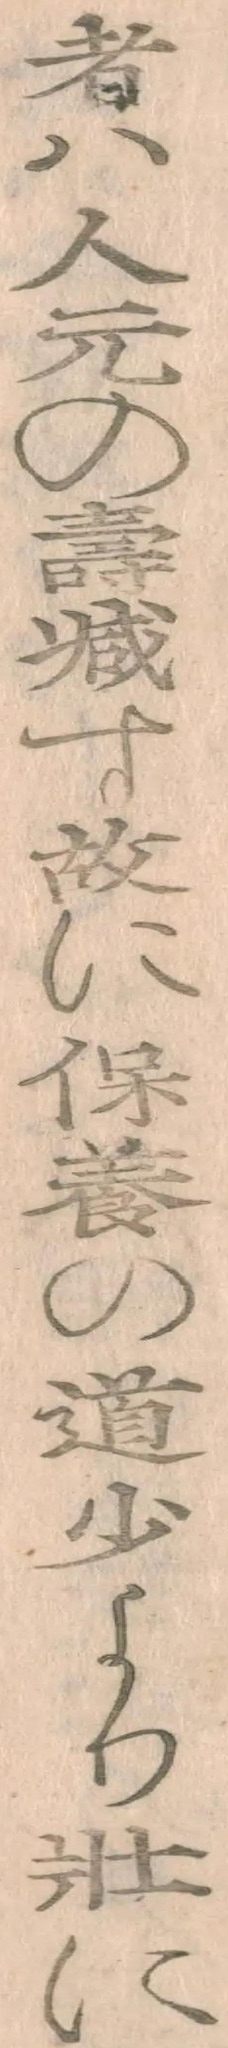者は人元の寿減す故に保養の道少より壮に
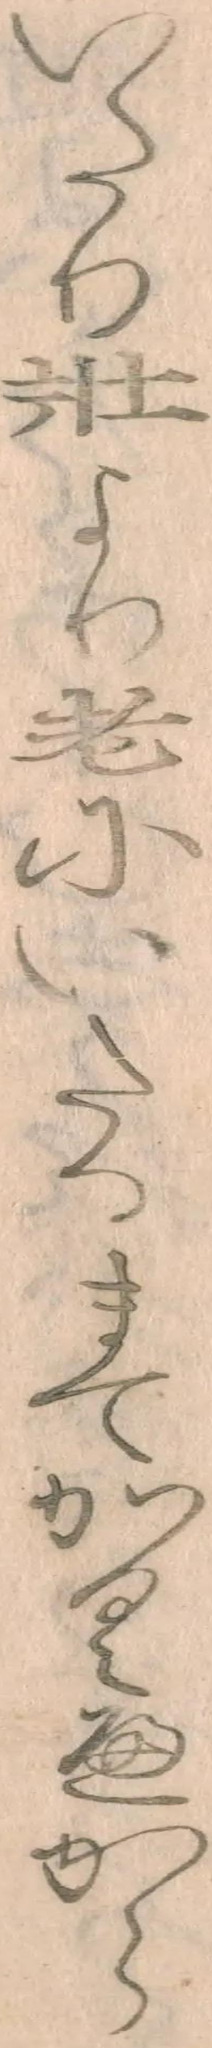いたり壮より老にいたるまてかくへから
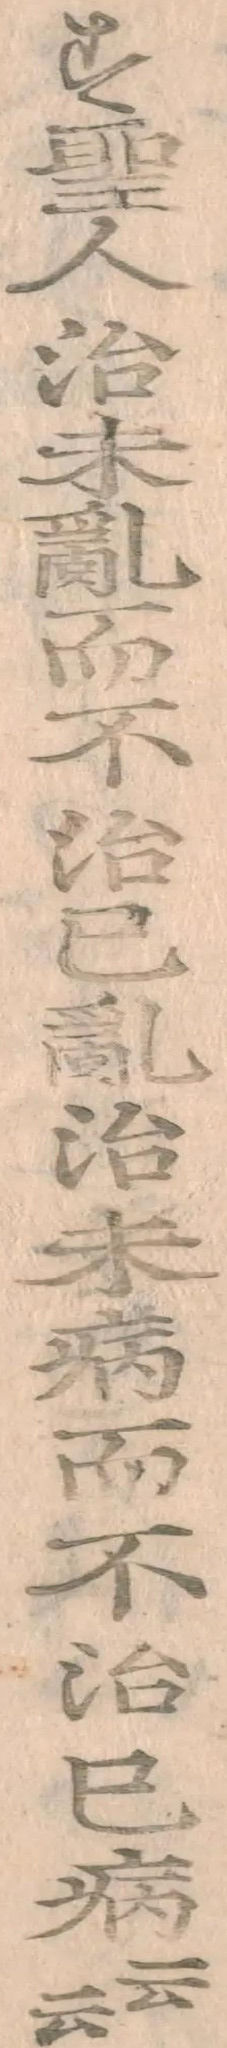す聖人治未乱而不治巳乱治未病而不治巳病云云
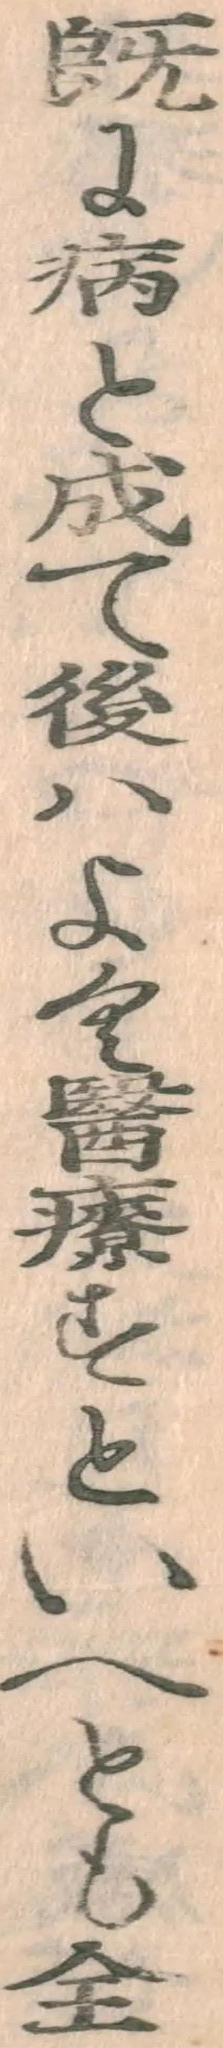既に病と成て後はよく医療すといへとも全
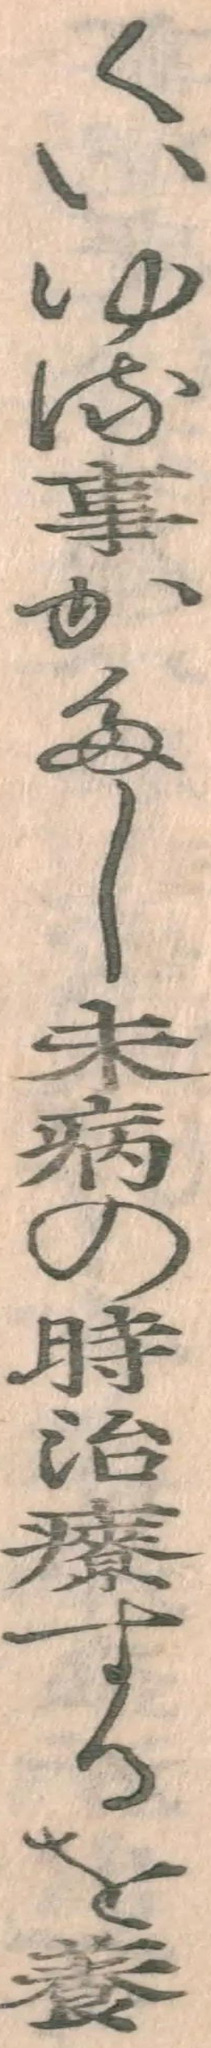くいゆる事かたし未病の時治療するを養
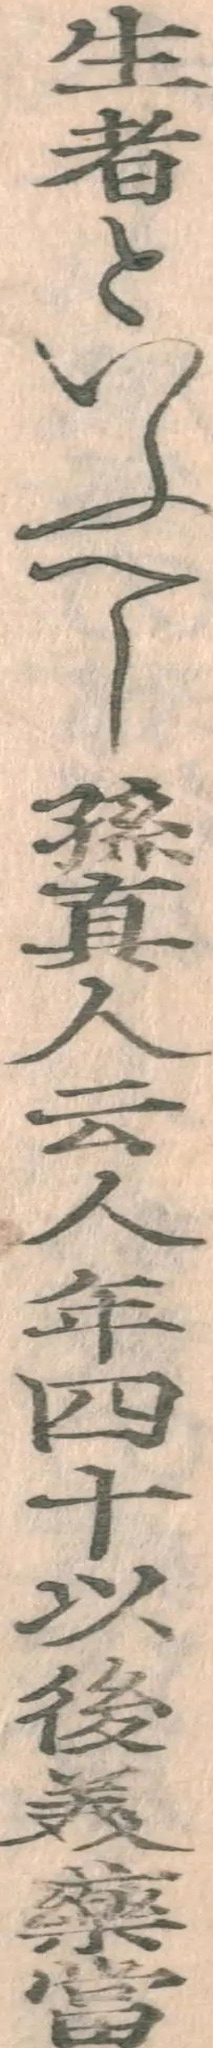生者といふへし孫真人云人年四十以後美薬当
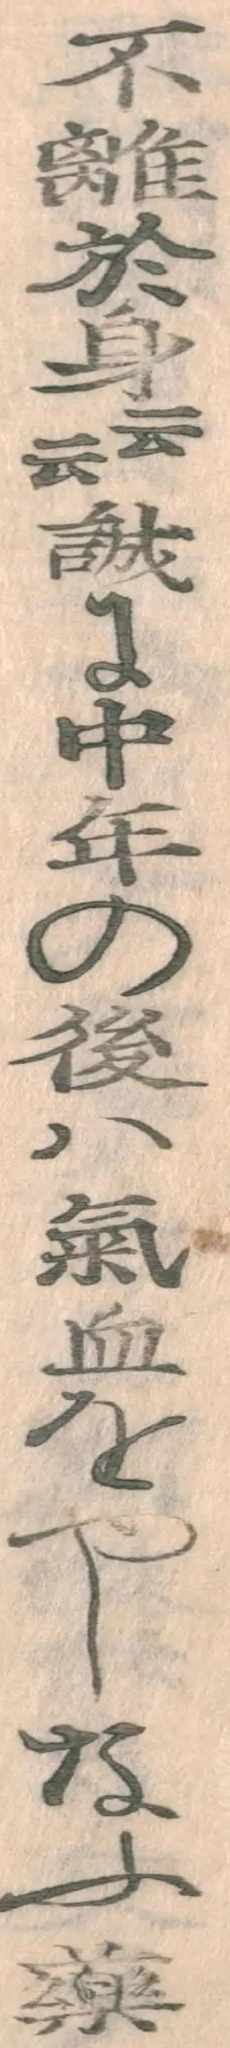不離於身云云誠に中年の後は気血をやしなふ薬
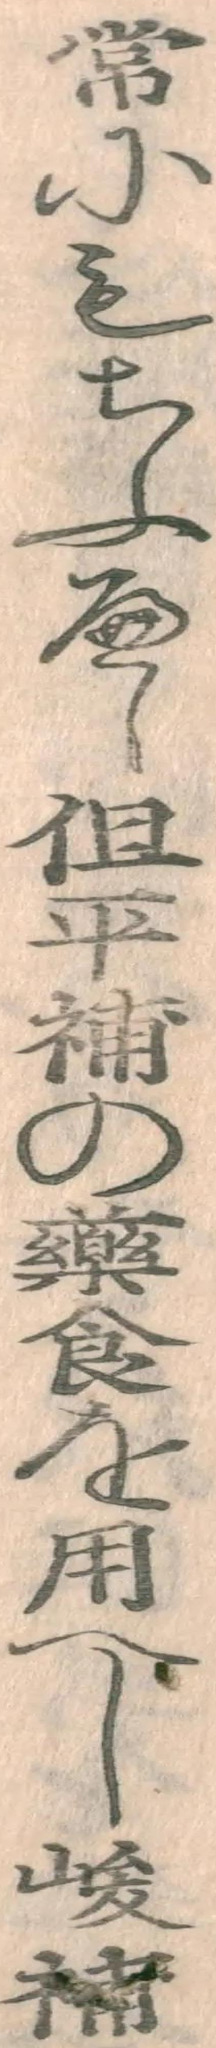常にもちふへし但平補の薬食を用へし峻補
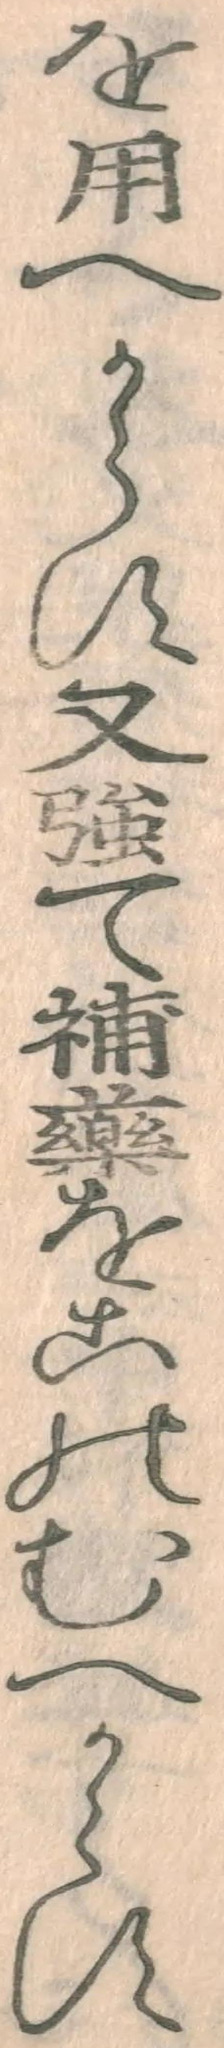を用へからす又強て補薬をこのむへからす
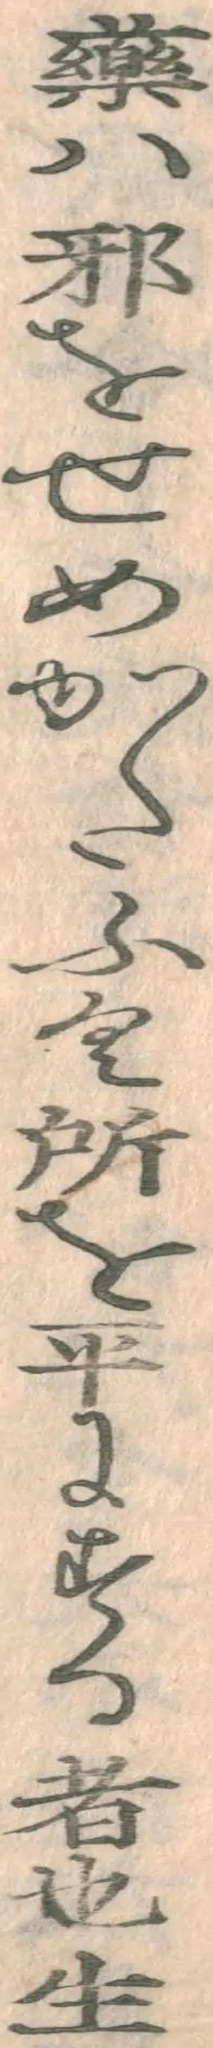薬は邪をせめかたふく所を平にする者也生
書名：延壽撮要
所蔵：国立国会図書館 National Diet Library, JAPAN
